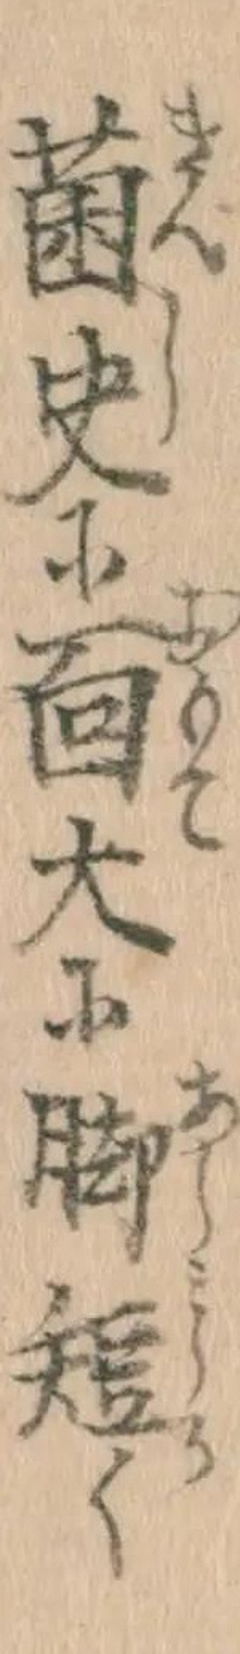菌史に面大に脚短く
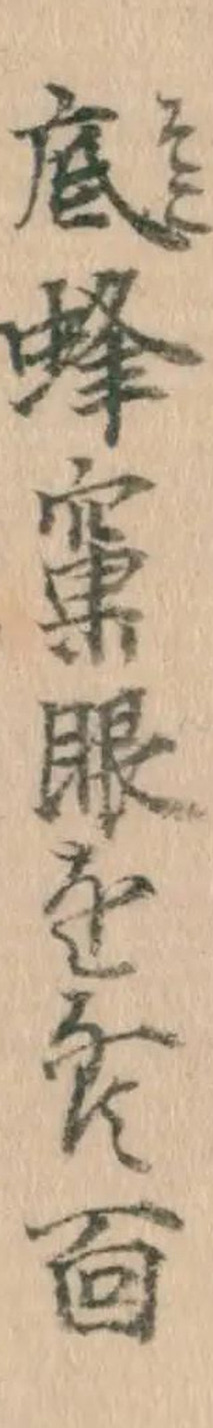底蜂窠眼をなす面
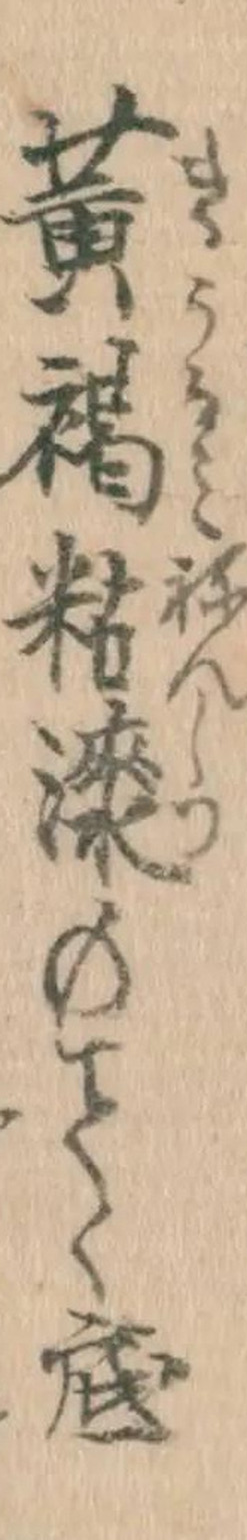黄褐粘漆のことく底
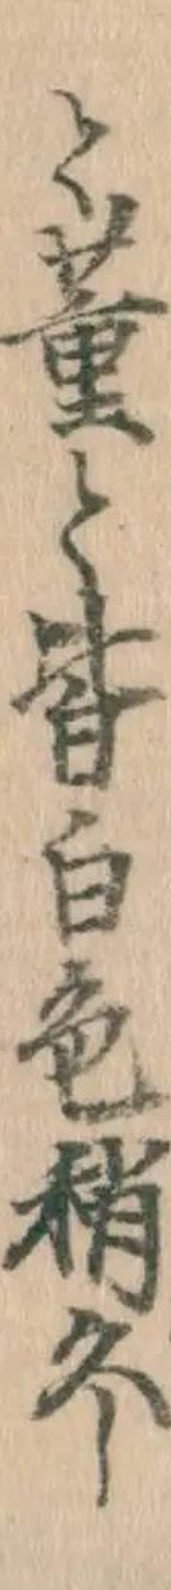と董と皆白色稍久し
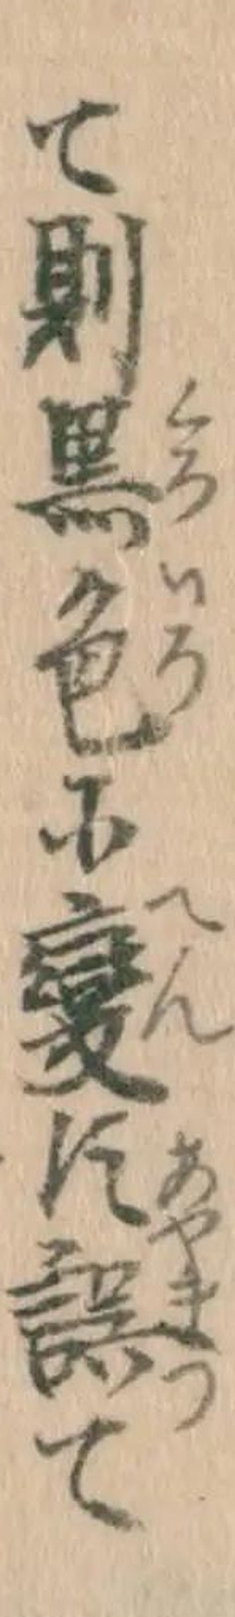て則黒色に変す誤て
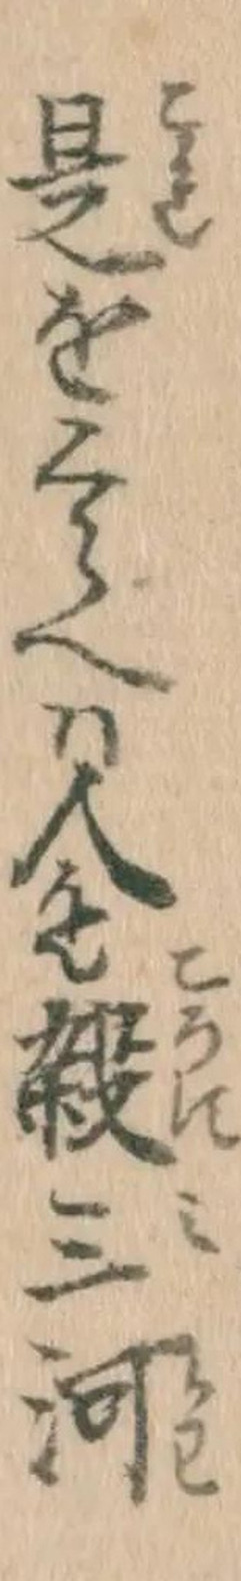是をくらへは人を殺三河
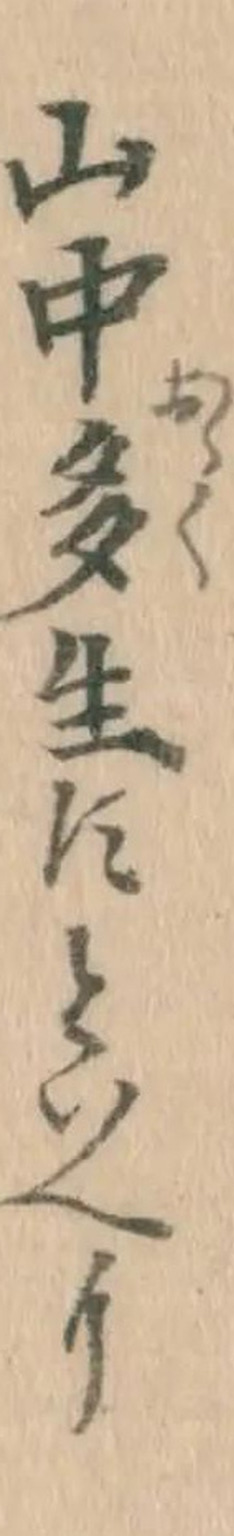山中多生すといへり

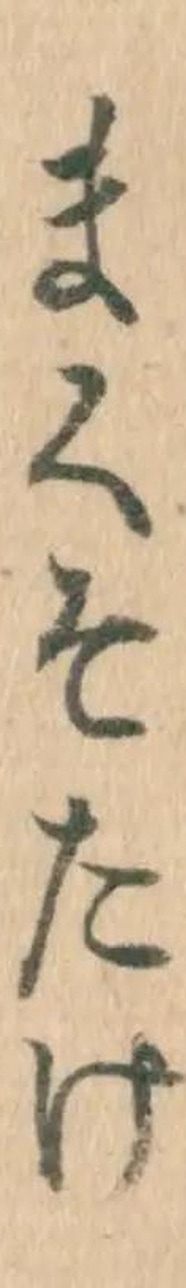まくそたけ
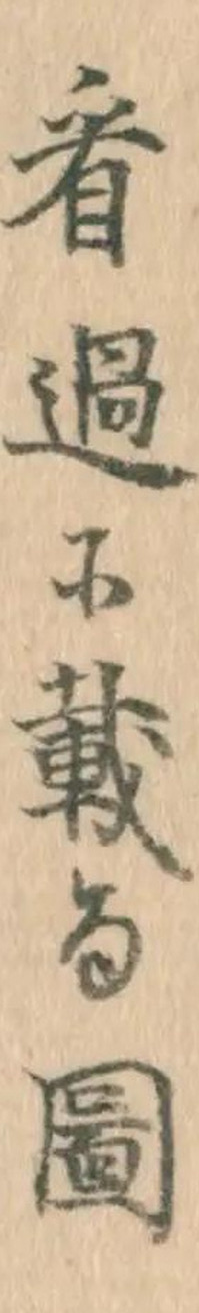看過に載る図
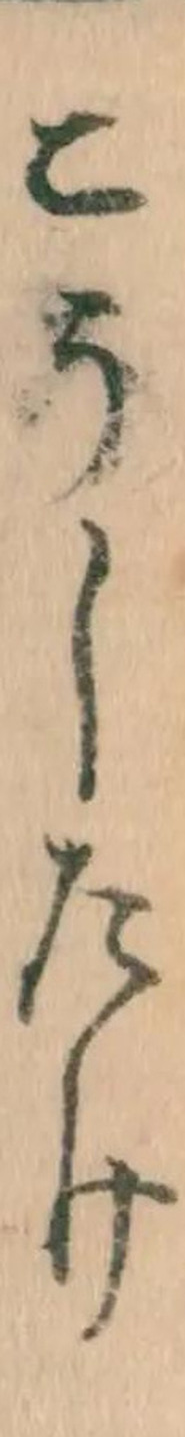こうしたけ
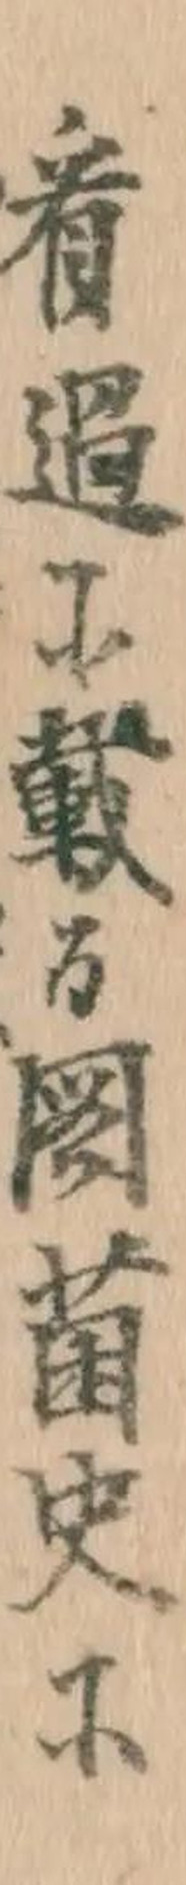看過に載る図菌史に
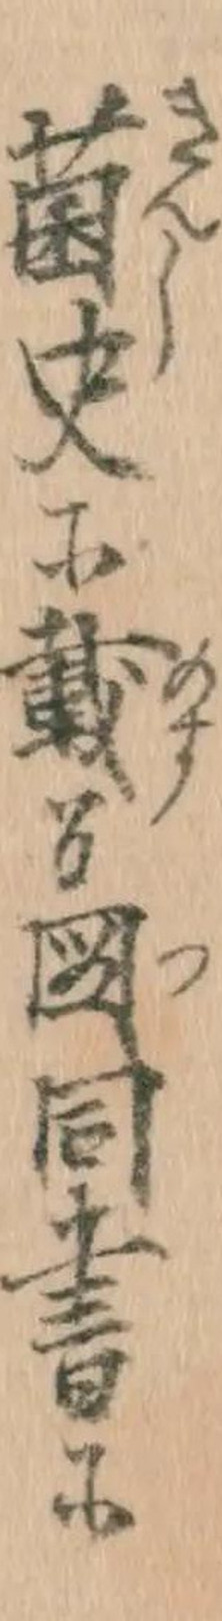菌史に載る図同書に
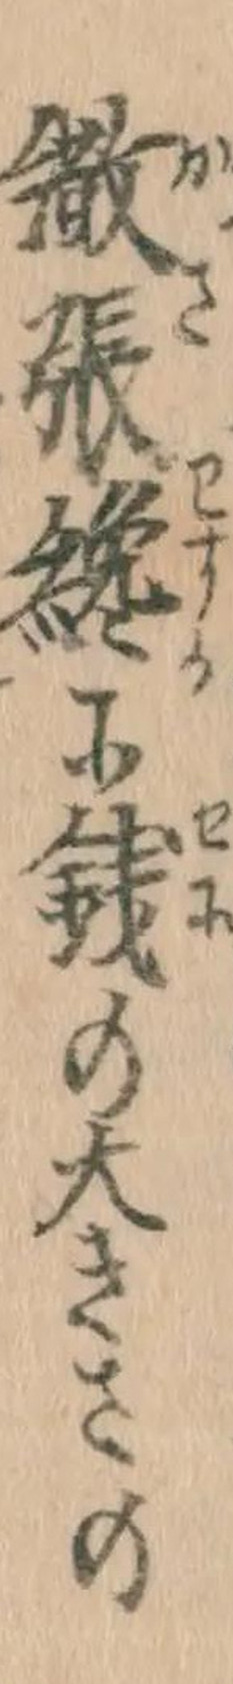徹張纔に銭の大きさの
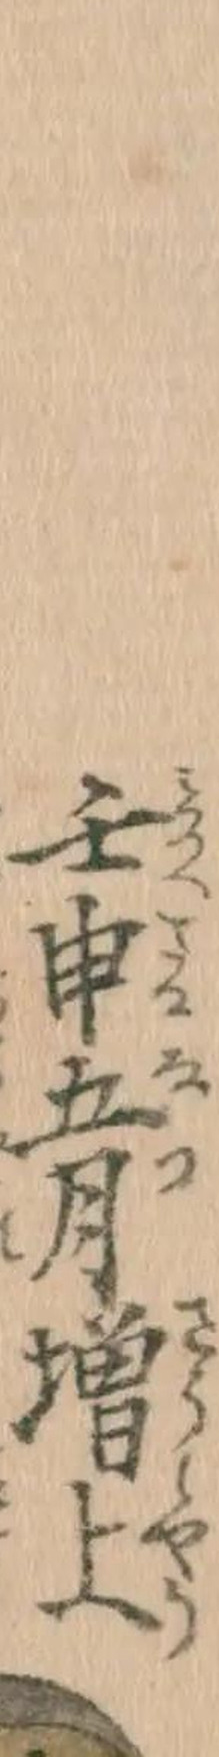壬申五月増上
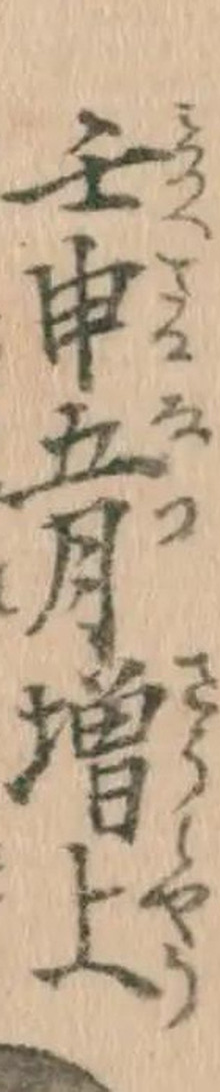壬申五月増上
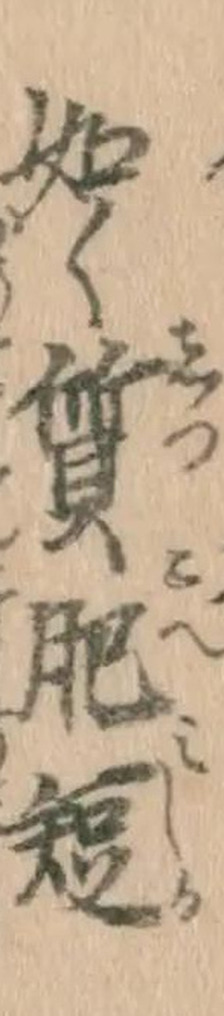如く質肥短
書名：本草図譜. 巻58-60
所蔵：国立国会図書館 National Diet Library, JAPAN
